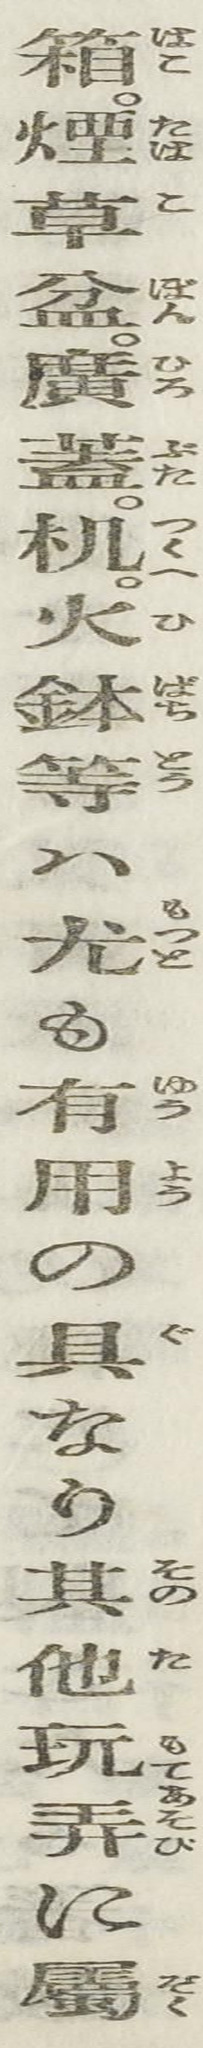箱。煙草盆。広蓋。机。火鉢等は尤も有用の具なり其他玩弄に属
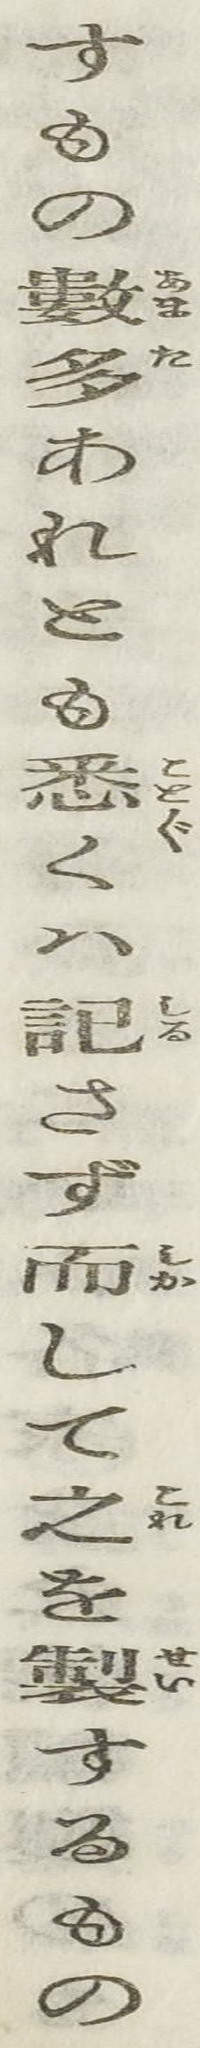するもの数多あれとも悉くは記さず而して之を製するもの
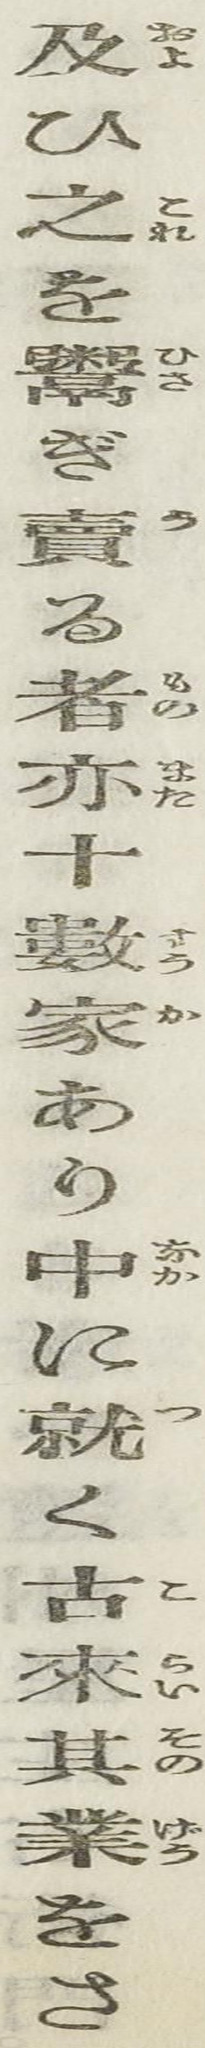及び之を鬻ぎ売る者亦十数家あり中に就く古来其業をさ

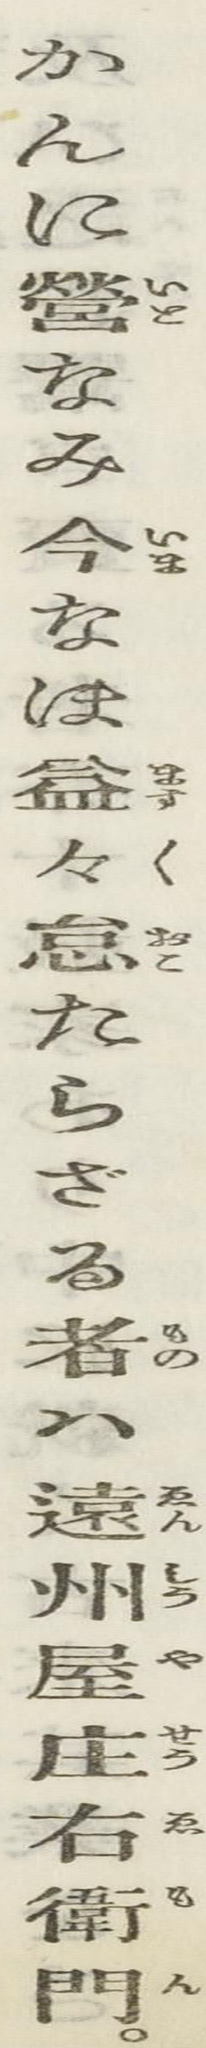かんに営なみ今なほ益々怠たらざる者は遠州屋庄右衛門。
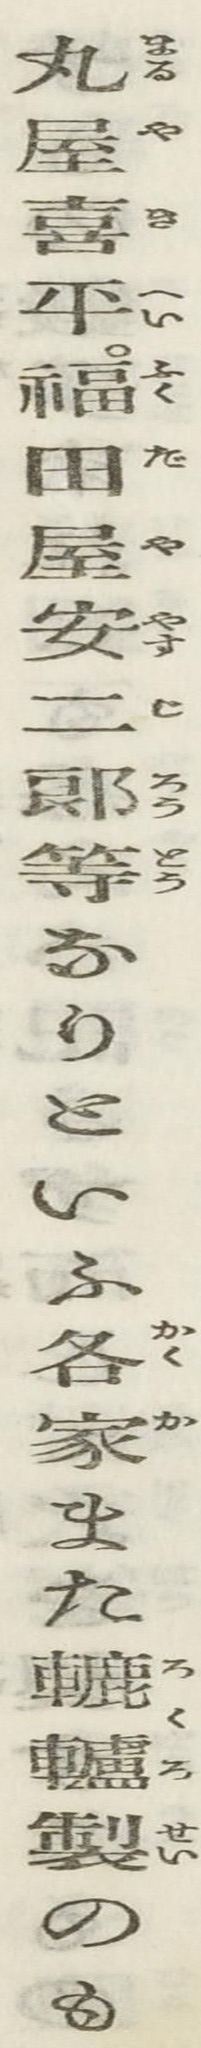丸屋喜平。福田屋安二郎等なりといふ各家また轆轤製のも
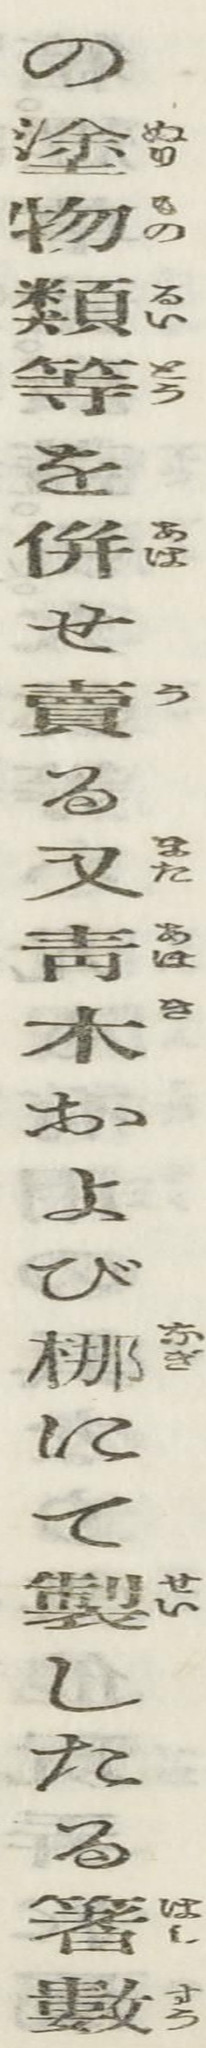の塗物類等を併せ売る又青木および梛にて製したる箸数
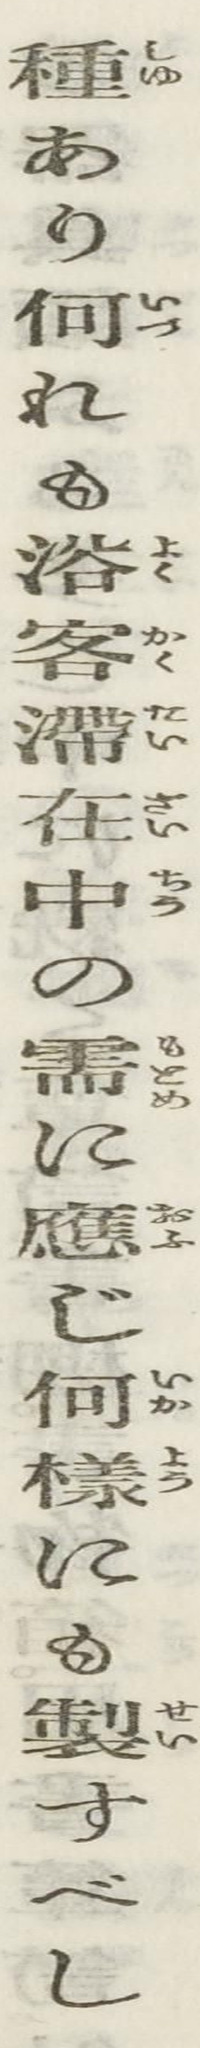種あり何れも浴客滞在中の需に応じ何様にも製すべし
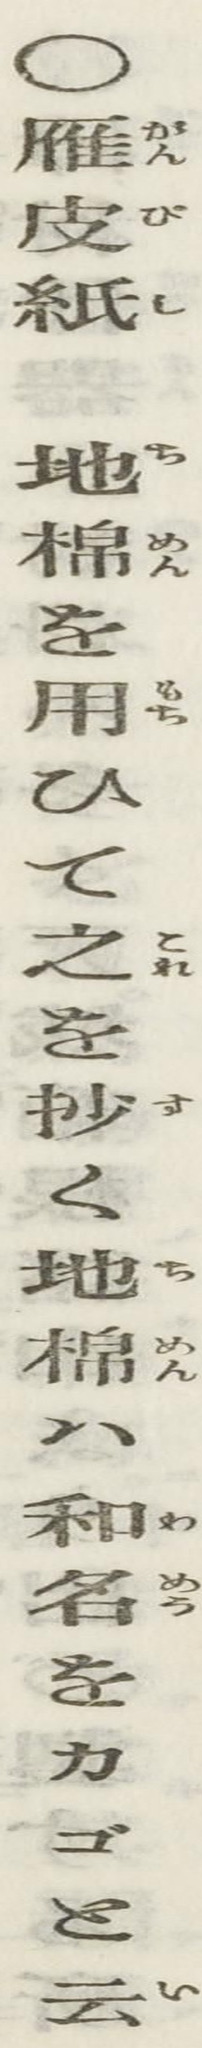○雁皮紙地棉を用ひて之を抄く地棉は和名をカゴと云
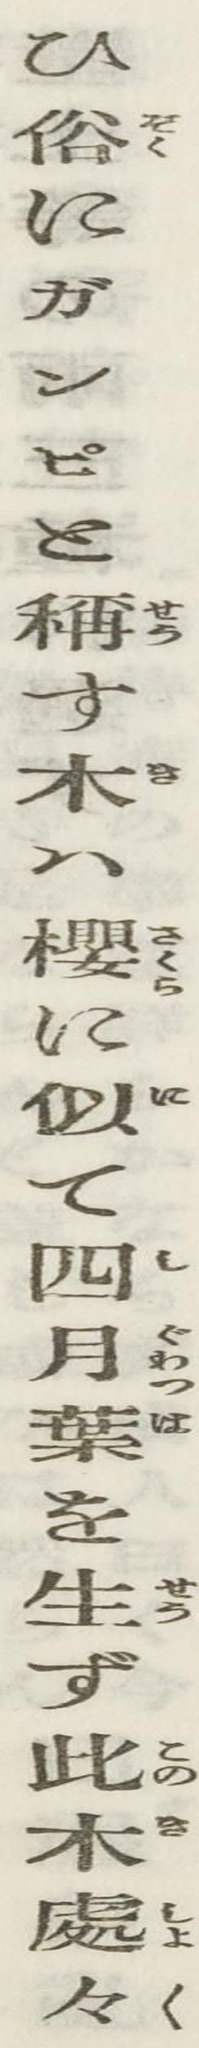ひ俗にガンピと称す木は桜に似て四月葉を生ず此木処々
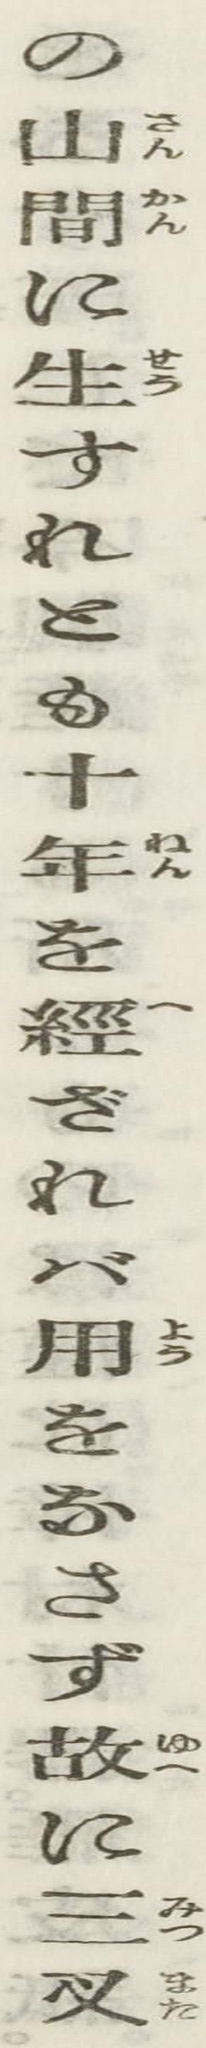の山間に生すれとも十年を経ざれば用をなさず故に三叉
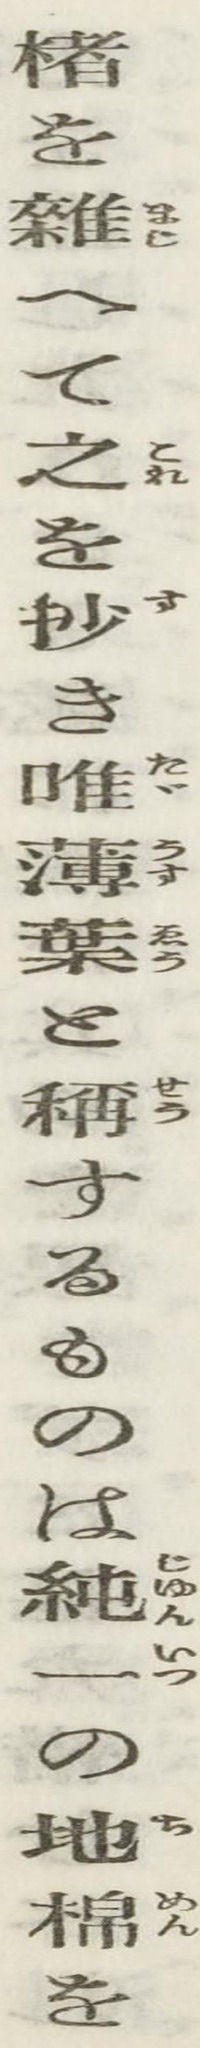楮を雑へて之を抄き唯薄葉と称するものは純一の地棉を
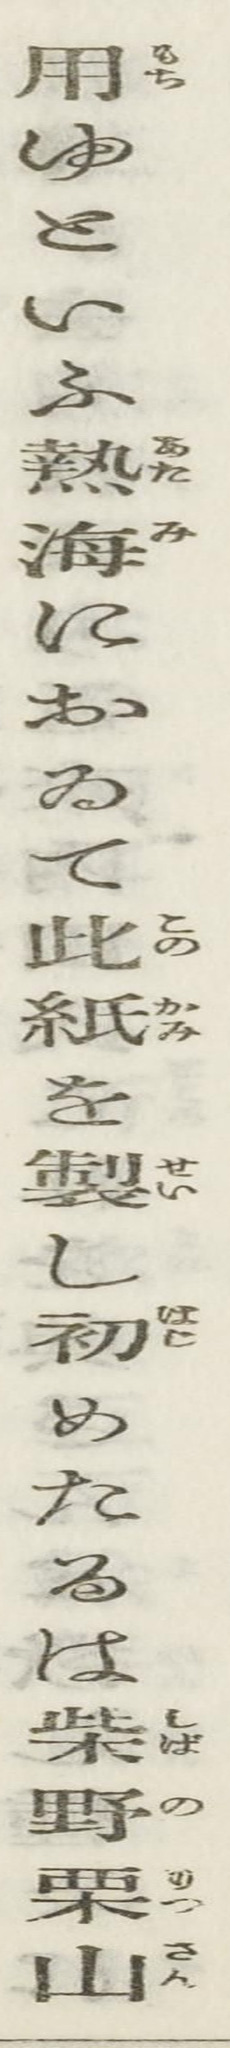用ゆといふ熱海におゐて此紙を製し初めたるは柴野栗山
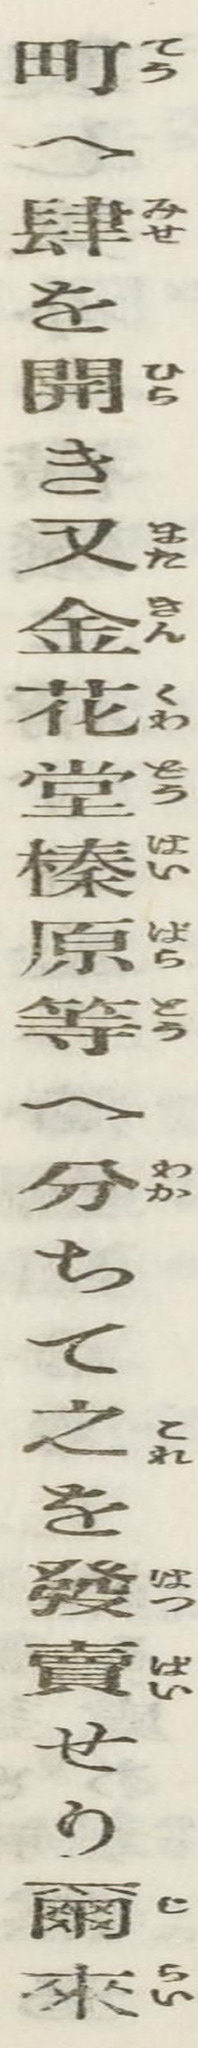町へ肆を開き又金花堂榛原等へ分ちて之を発売せり爾来
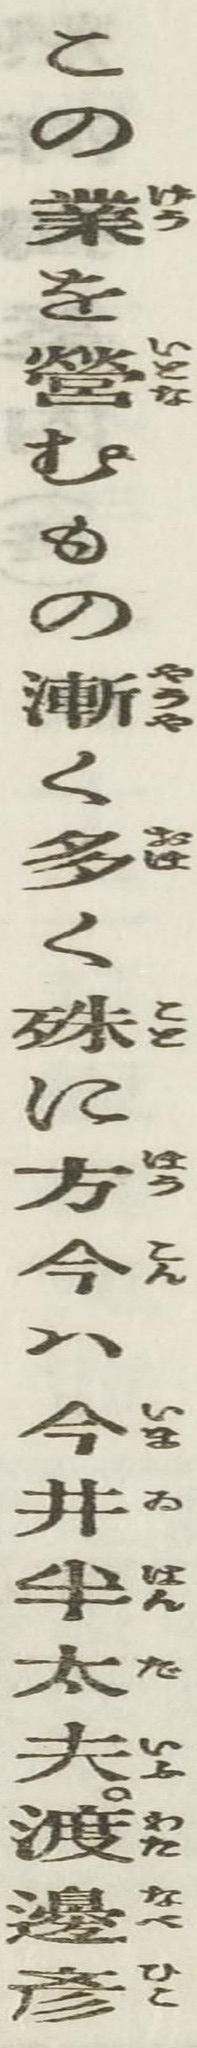この業を営むもの漸く多く殊に方今は今井半太夫。渡辺彦
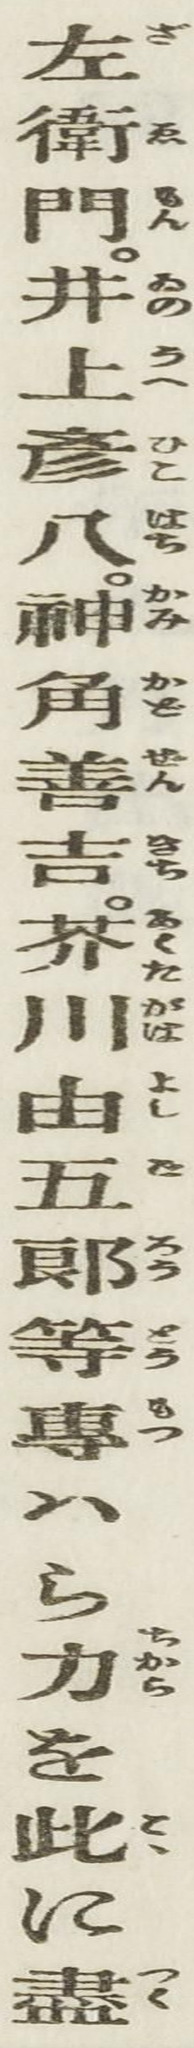左衛門。井上彦八。神角善吉。芥川由五郎等専はら力を此に尽
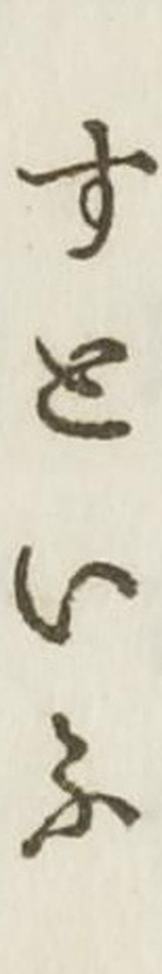すといふ
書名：熱海獨案内　全
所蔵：東京大学地震研究所図書室 Earthquake Research Institute Library, The University of Tokyo, JAPAN
